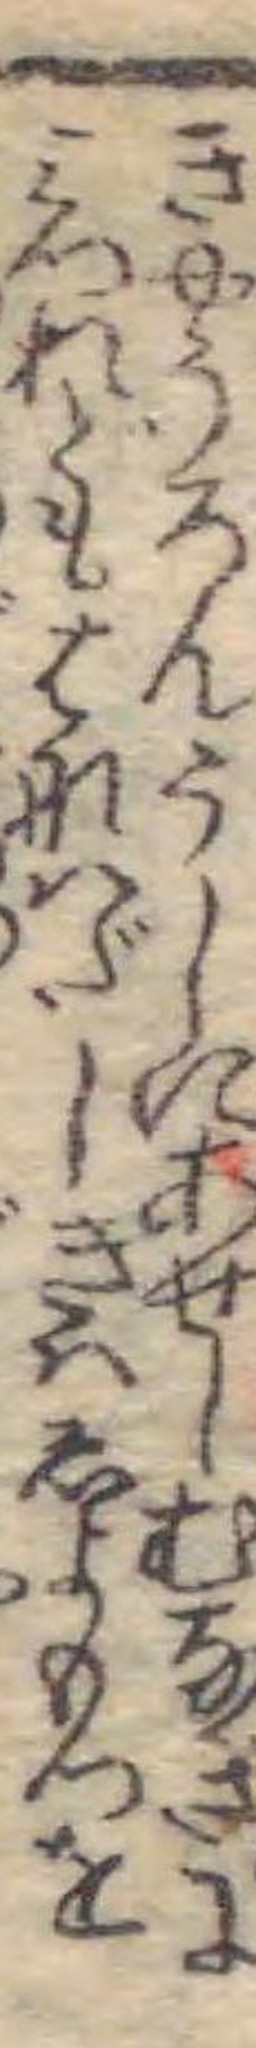みつれどもはなはだしきはしよもつを
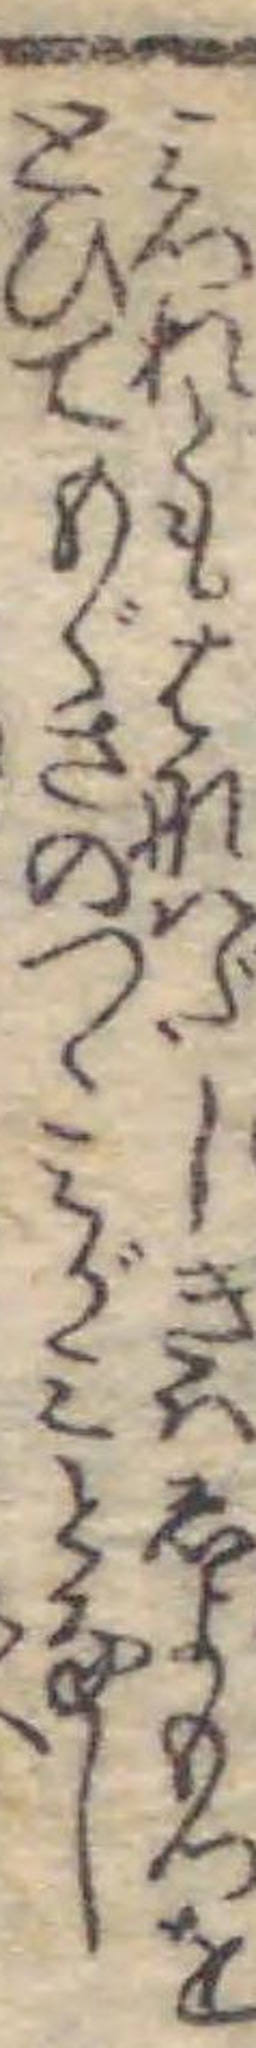とひてもぐさのつゝみがみとなし
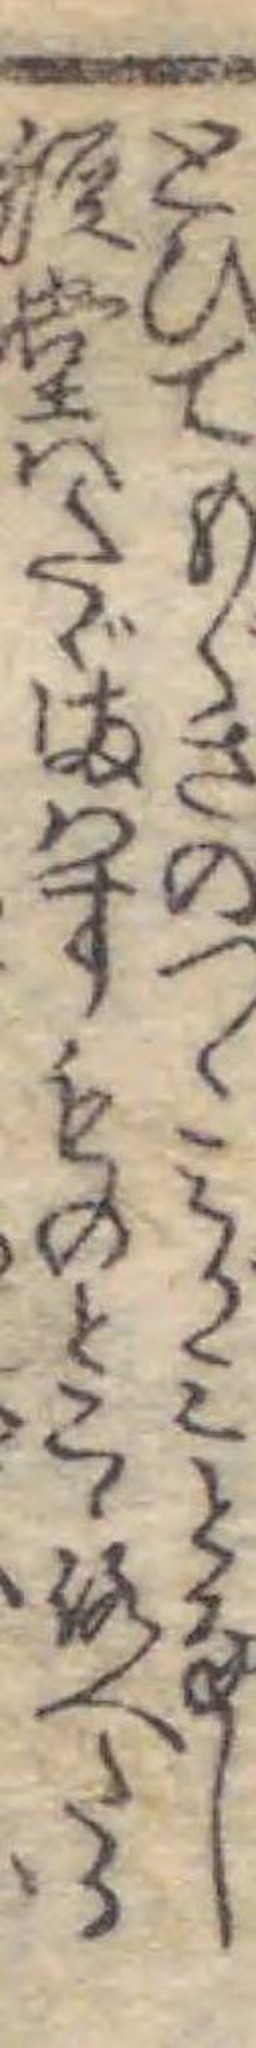経堂はたゞまはすものとこゝろへたる
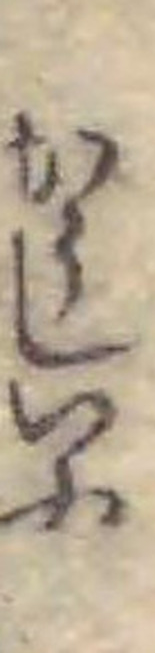かうしいふ
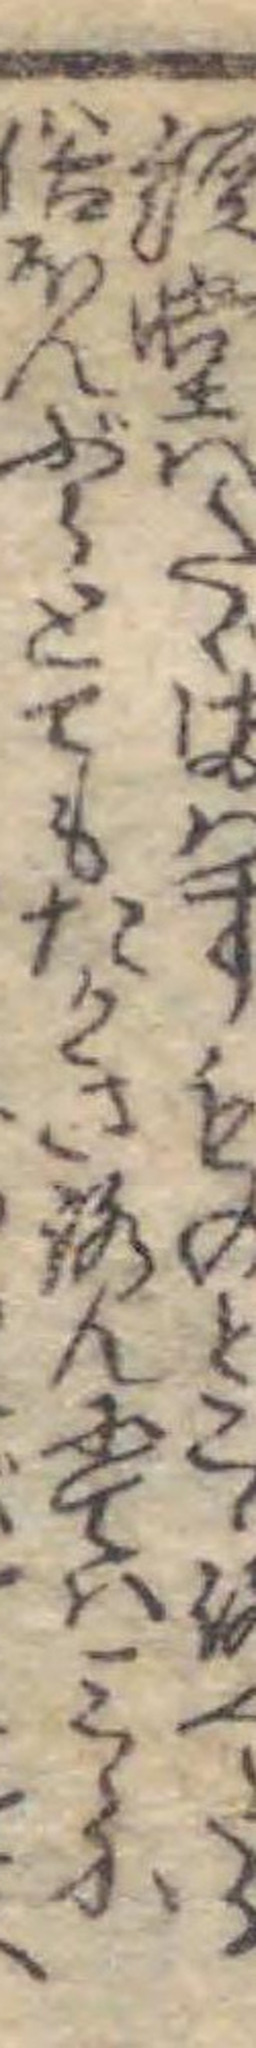俗ほんぶらとてもたかきろんにてはみゝに
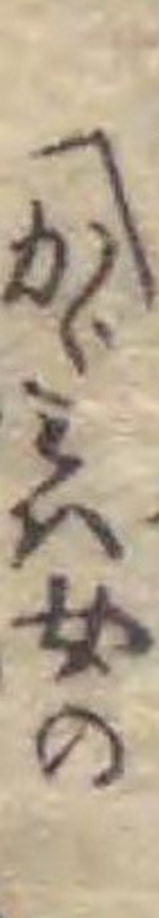〽かゞみは女の
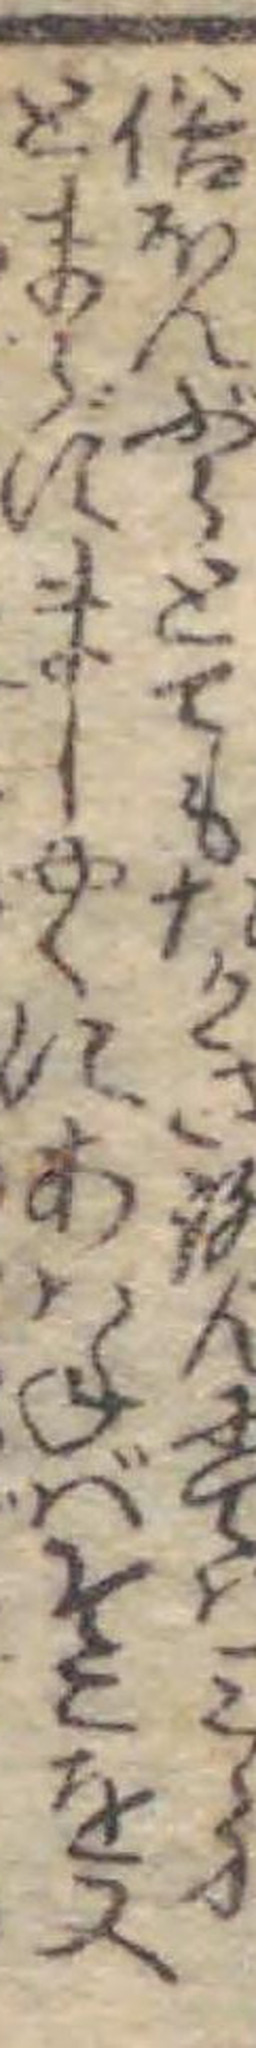とまらずましやくにあはねばそこを又
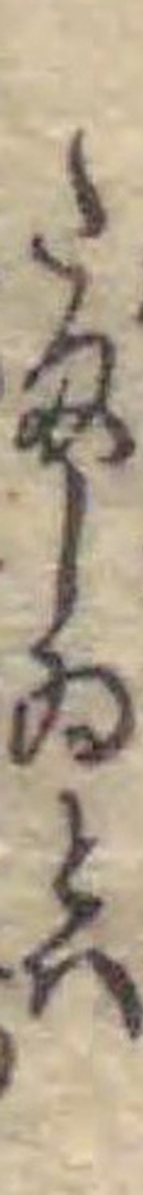たましゐとは
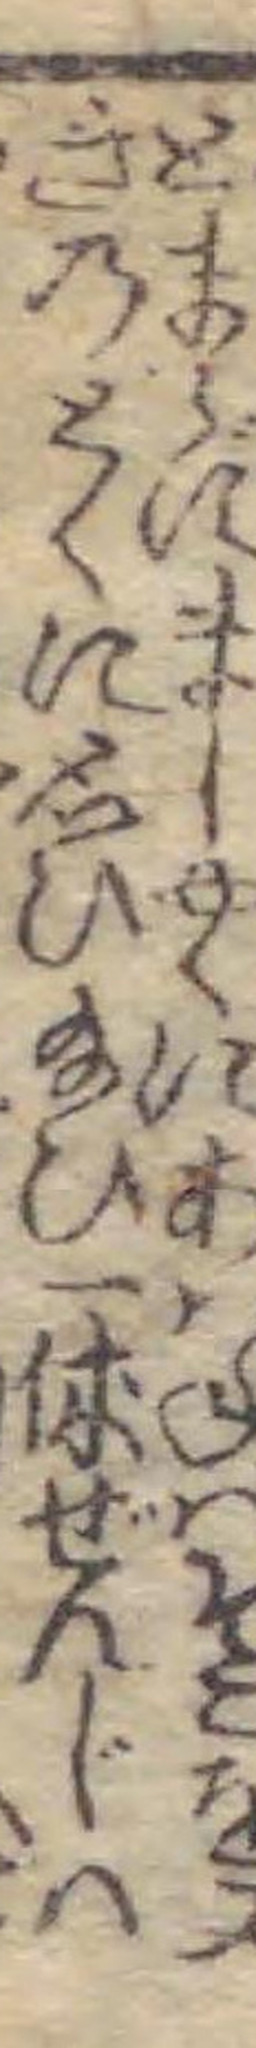きのとくに思ひ給ひ一休ぜんじは
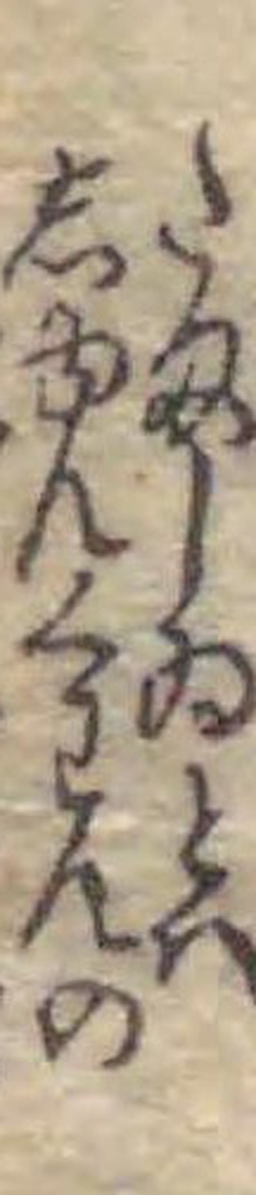しゆんくわんの
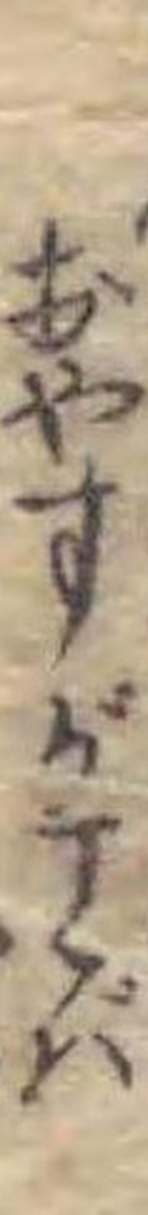おやすがことば
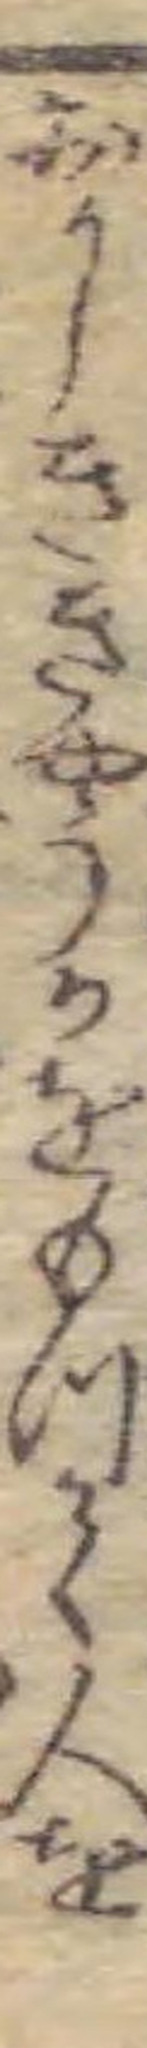おかしきやうかをもつて人を
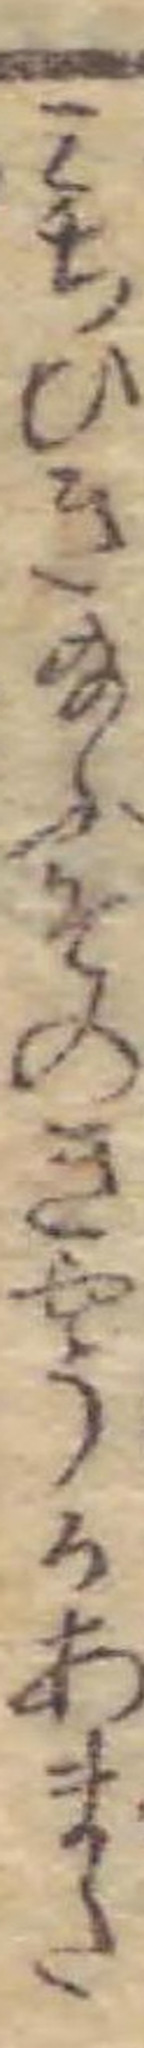みちひき給ふそのきやうかあまた
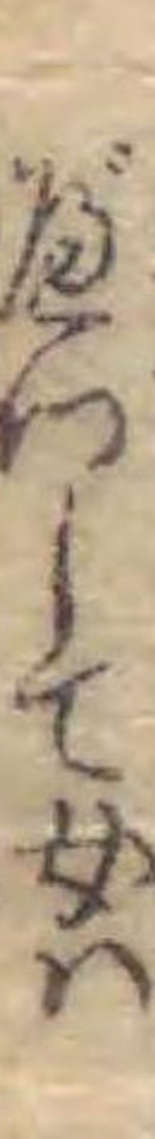べつして女は
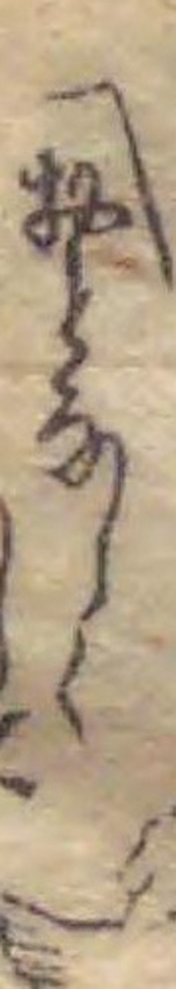〽おとなしく
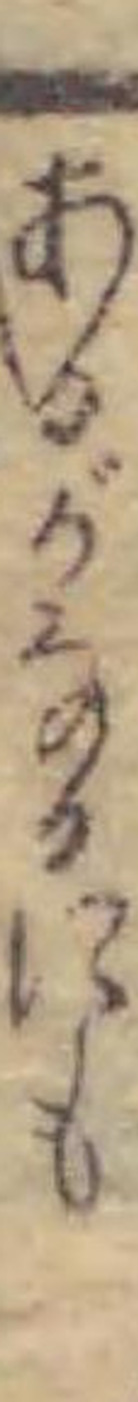あるがなるにも
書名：人心鏡写絵 : 3巻
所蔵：国立国会図書館 National Diet Library, JAPAN
